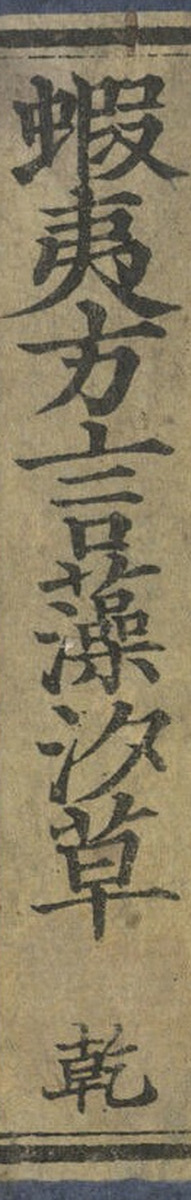蝦夷方言藻汐草乾

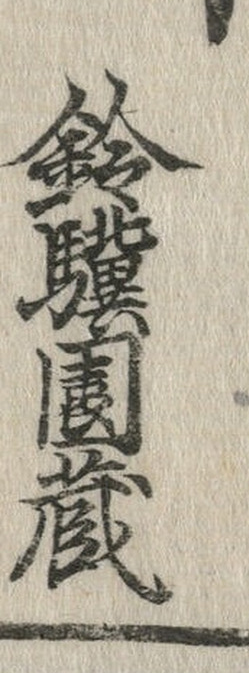鈴驥園蔵

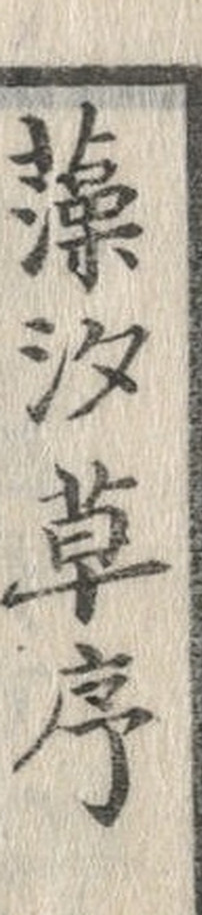藻汐草序
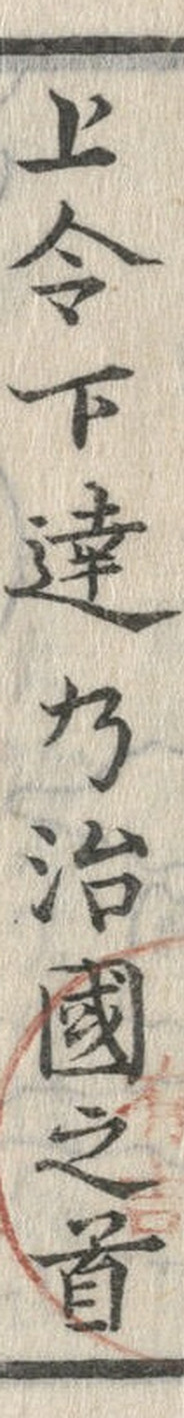上令下達乃治國之首
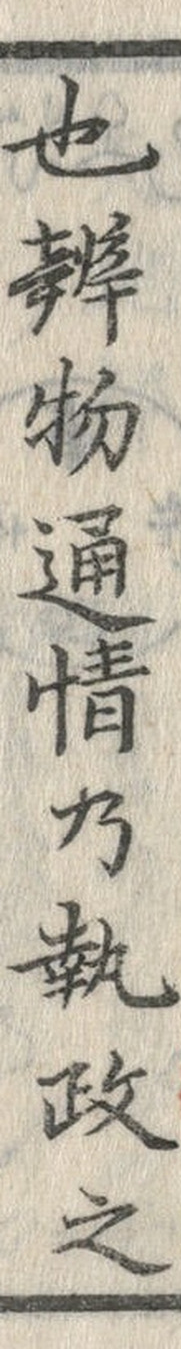也辨物通情方執政之
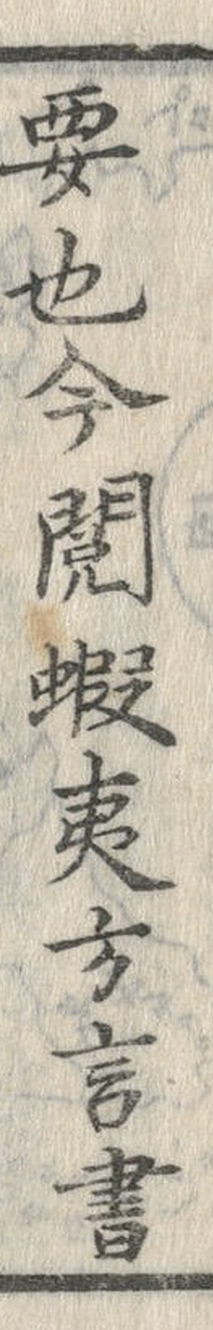要也今閱蝦夷方言書
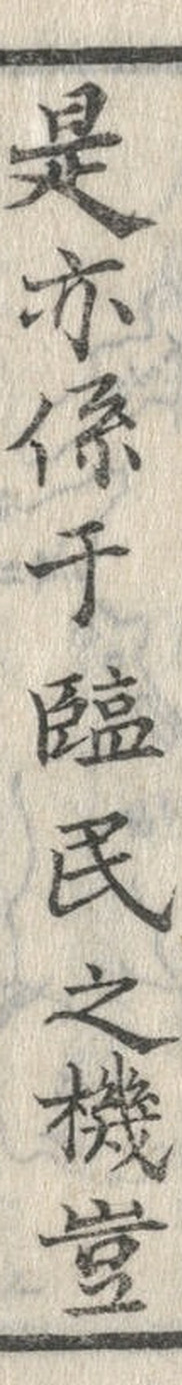是亦係于臨民之機豈
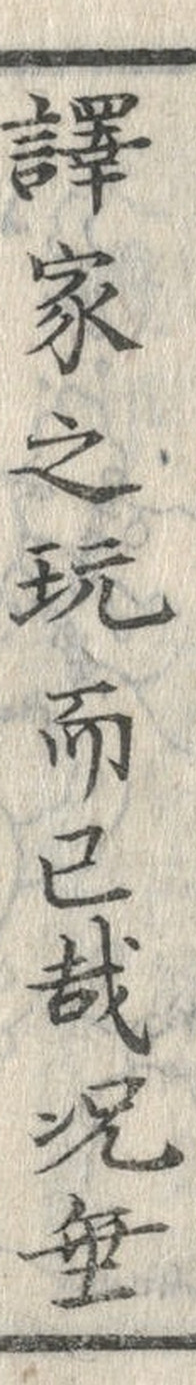譯家之玩而已哉況垂
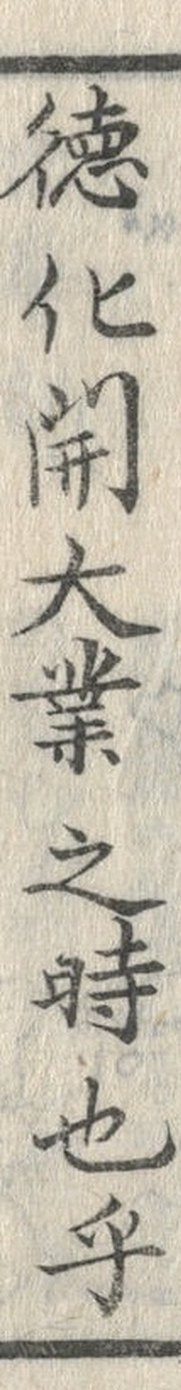德化開大業之時也乎
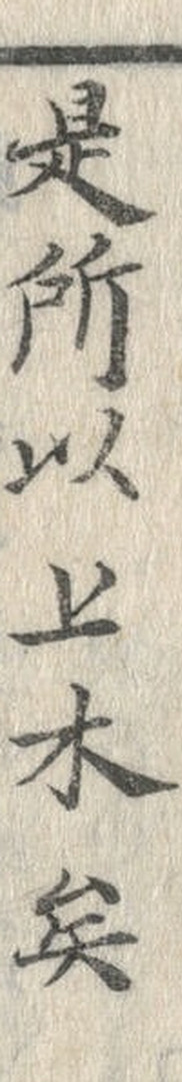是所以上木矣
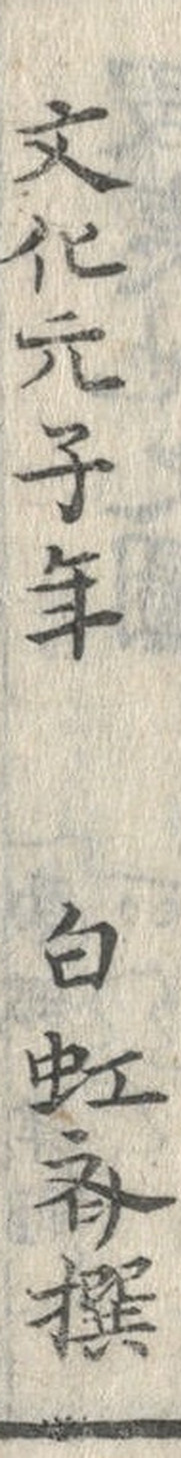文化元子年白虹斉撰

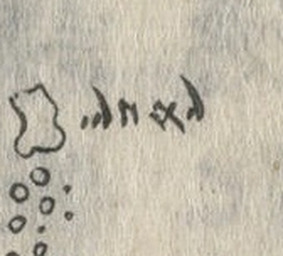シコタン
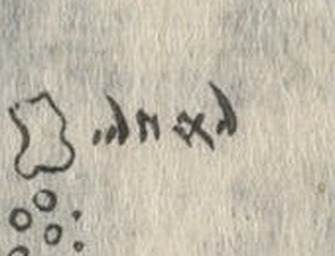シコタン
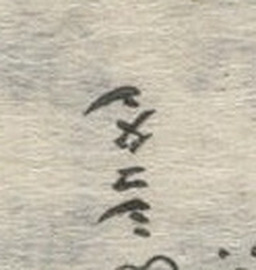シコタン
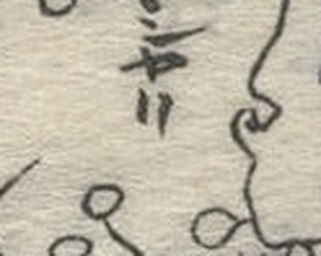シヤリ
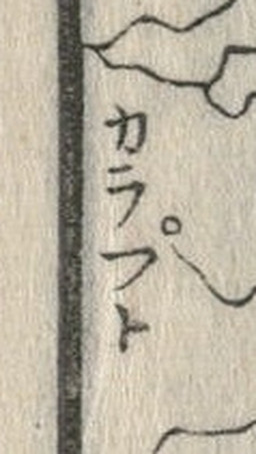カラプト
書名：蝦夷方言藻汐草　乾巻
